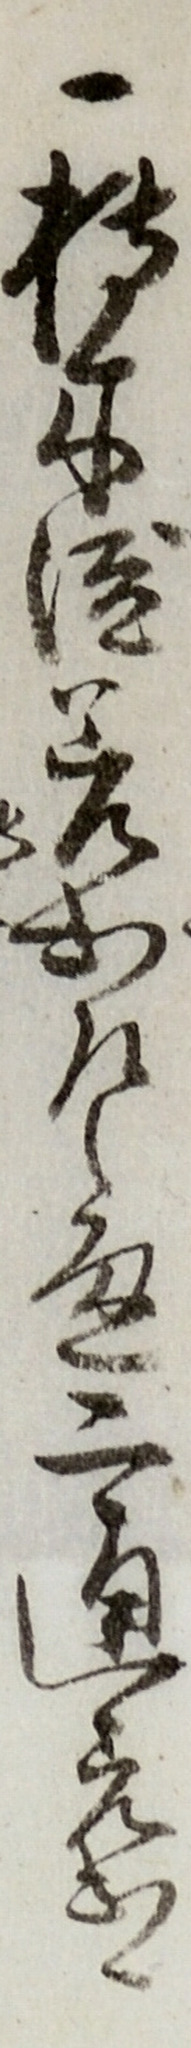一榑木渡差出左之通二通差出候
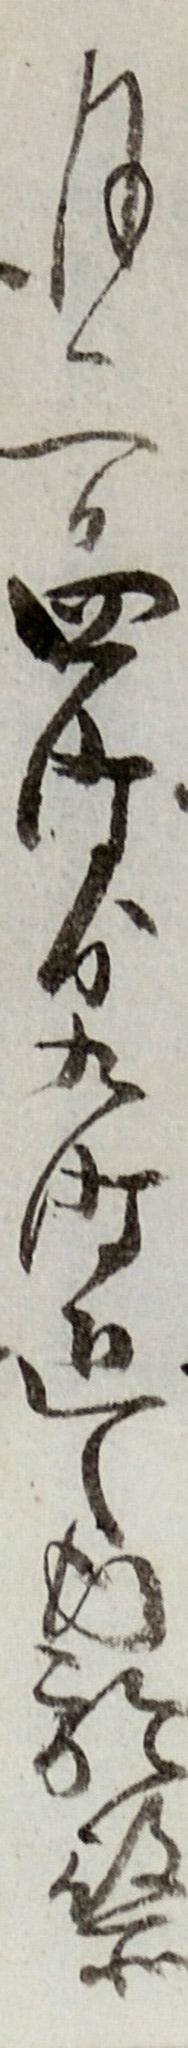月二日四時ゟ九時迄之内於役所
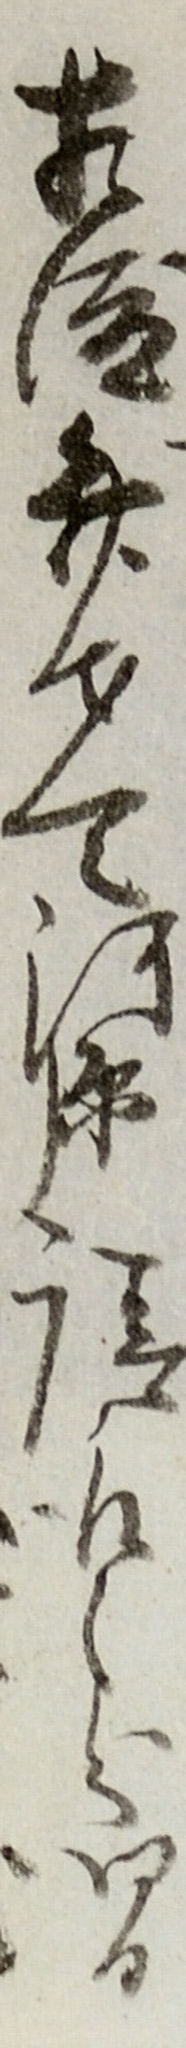相渡弁才天河原請取之分四日
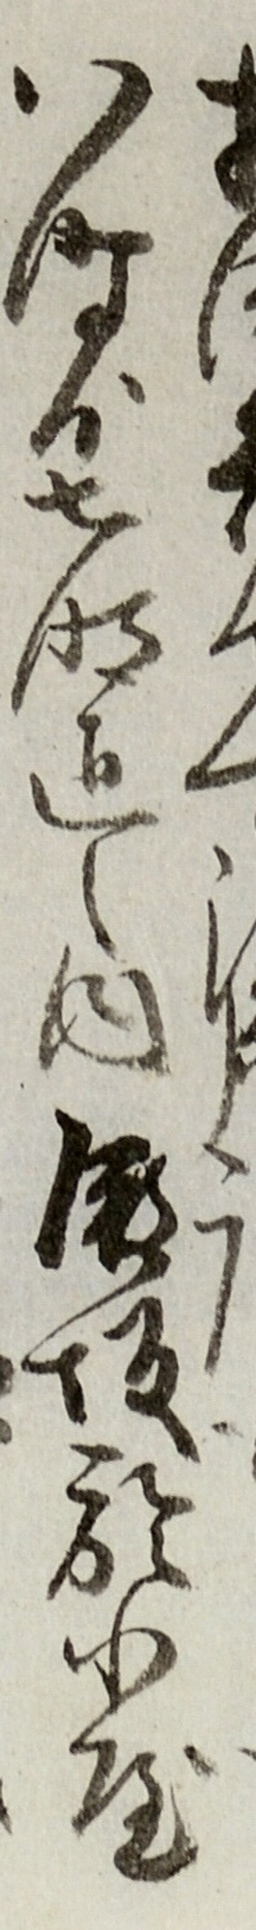八時ゟ七時迄之内殿坂於小屋
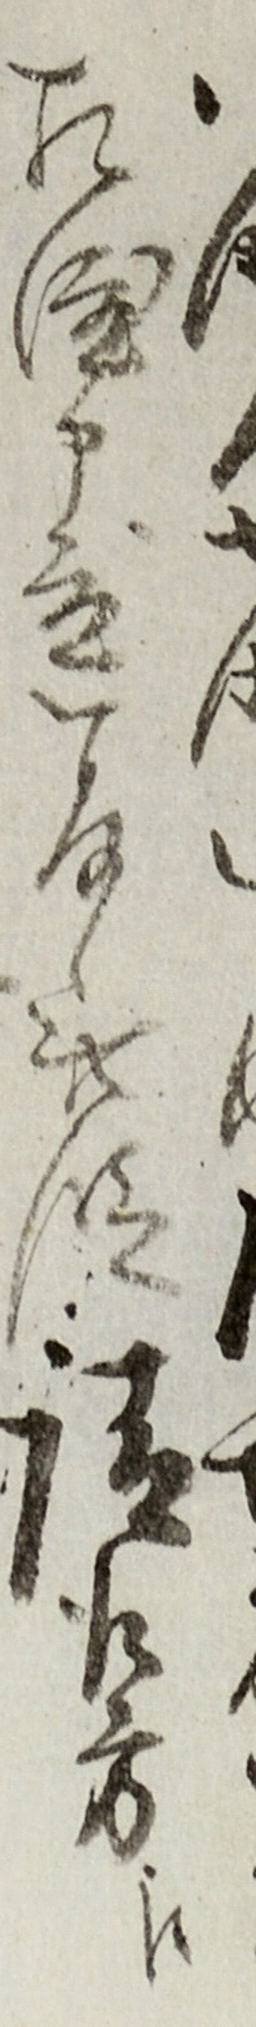相渡申度奉存候此段請取方江
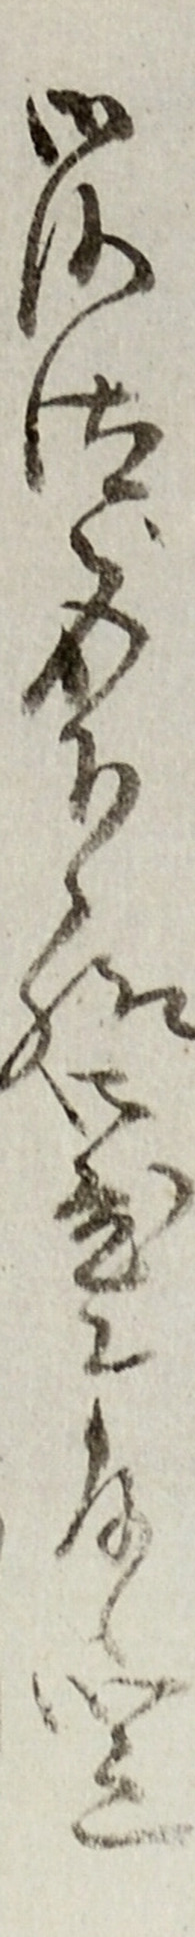御沙汰被成下候様仕度奉存候以上
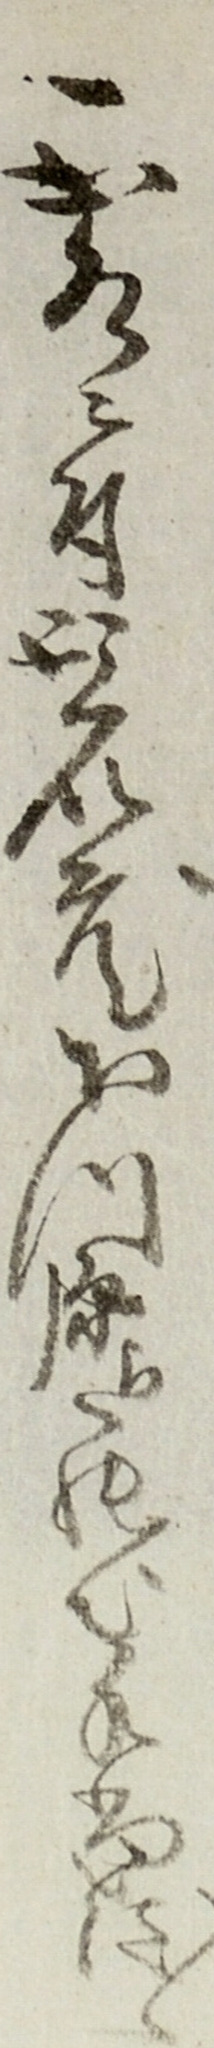一出水ニ付麗蔵下川原江罷出手当致候
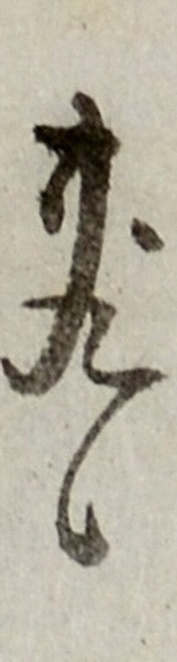廿九日
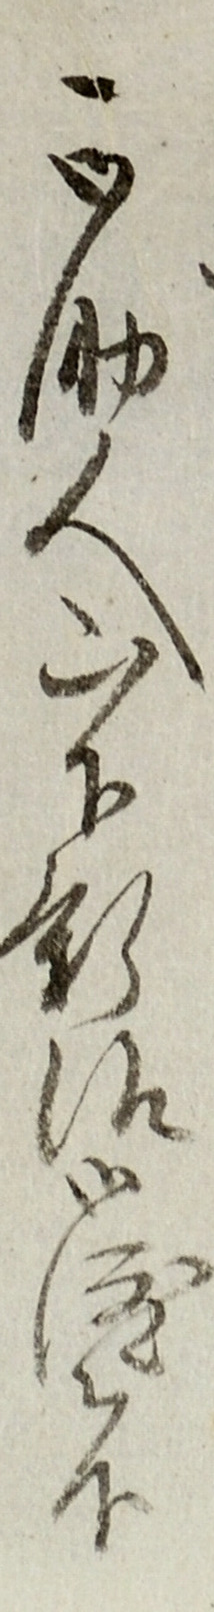一御助人山下新治御渡被下
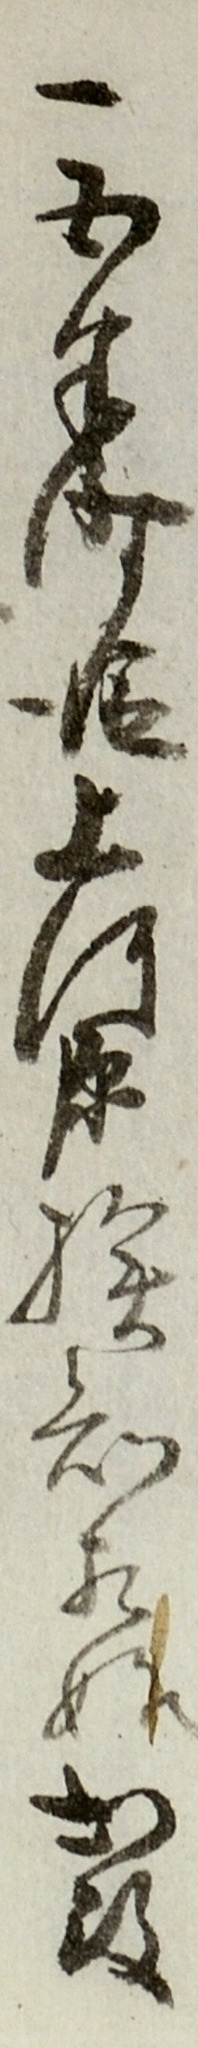一五半時従上河原検知相始出役
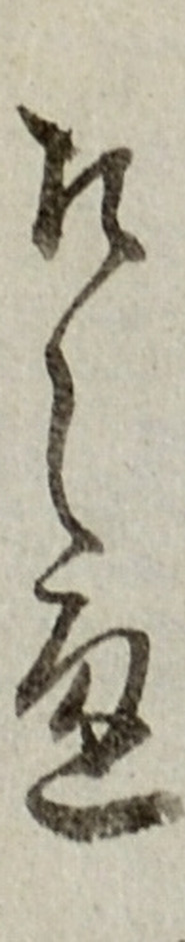左之通
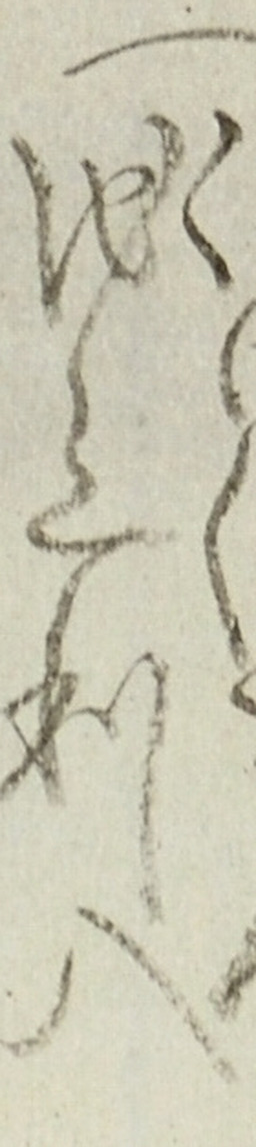池上利八
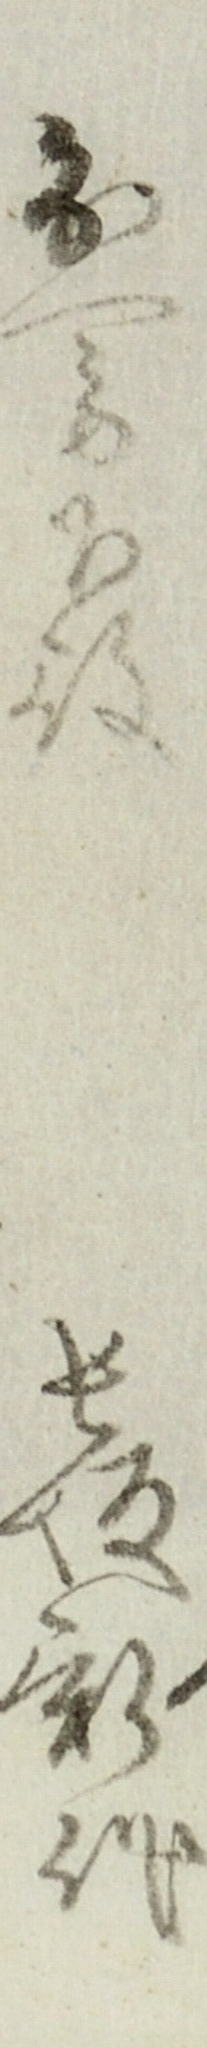分一方下役長坂新作
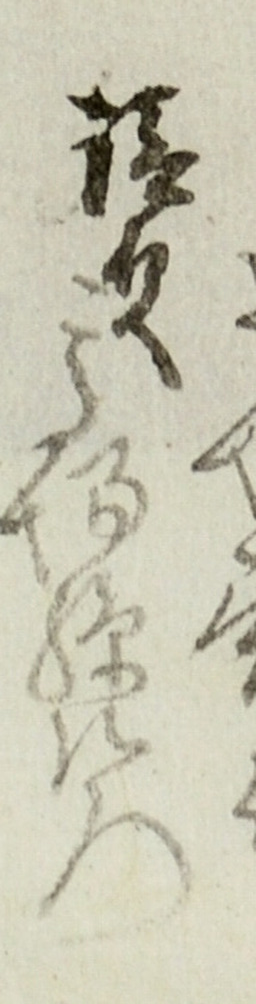請負馬場孫左衛門
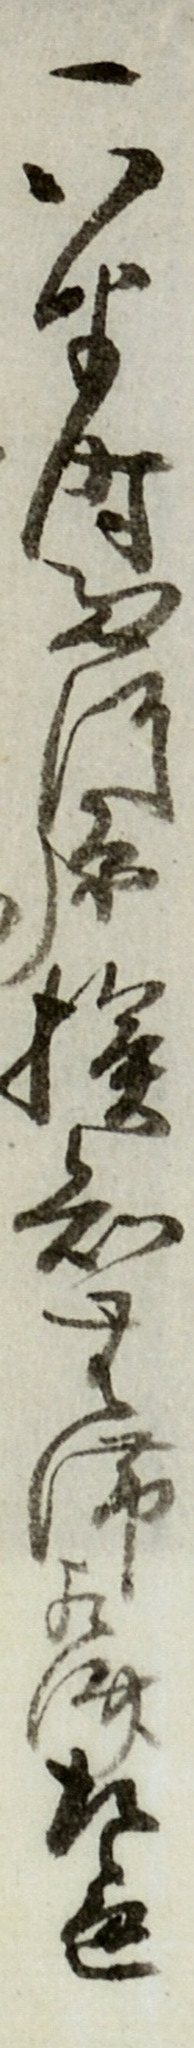一八半時両河原検知無滞相済左之通
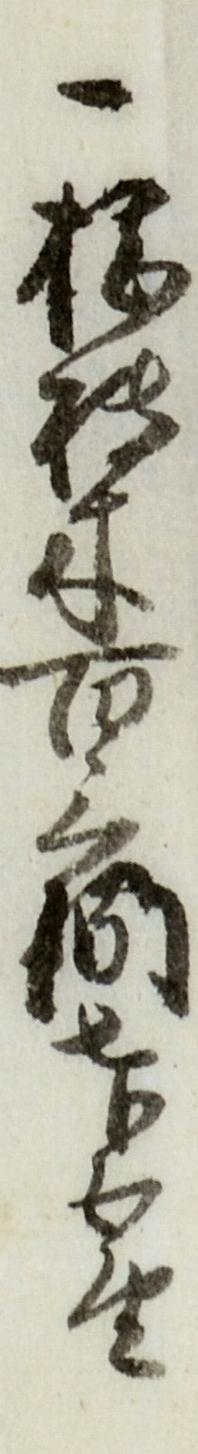一椹榑木百三間七歩五厘
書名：御山方御薪方諸事御用留
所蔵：伊那市立高遠町図書館・合同会社AMANE
